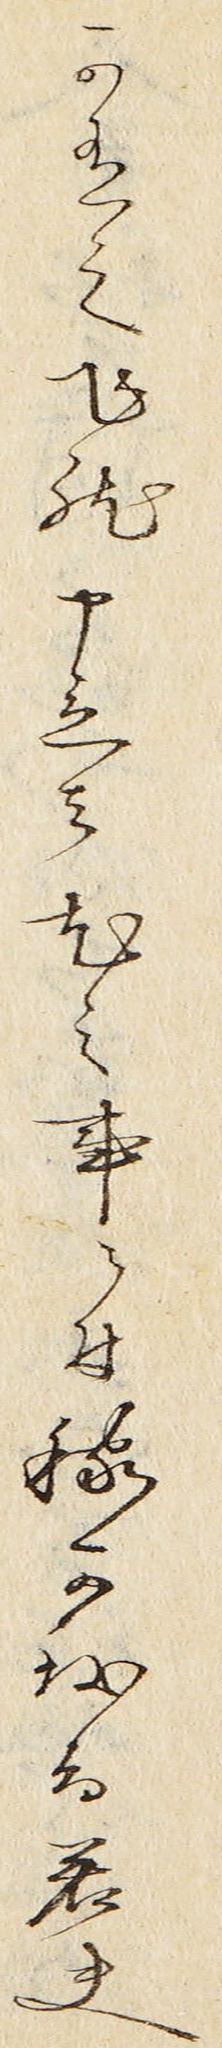可有之乍然申立は尤之事に付稼可致旨若夫
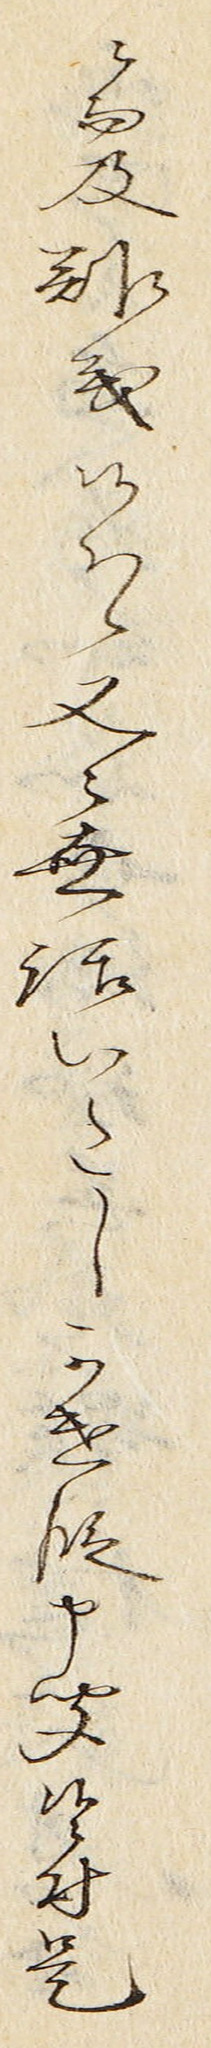に而及難義候はゝ又々世話いたし可遣段申聞候に付是
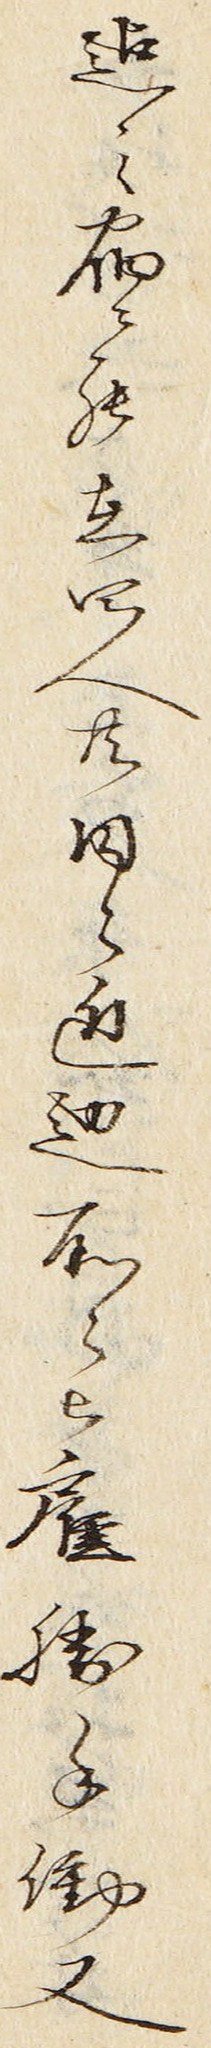迄之宿に罷在四人共日々近辺所々被雇勝手働又
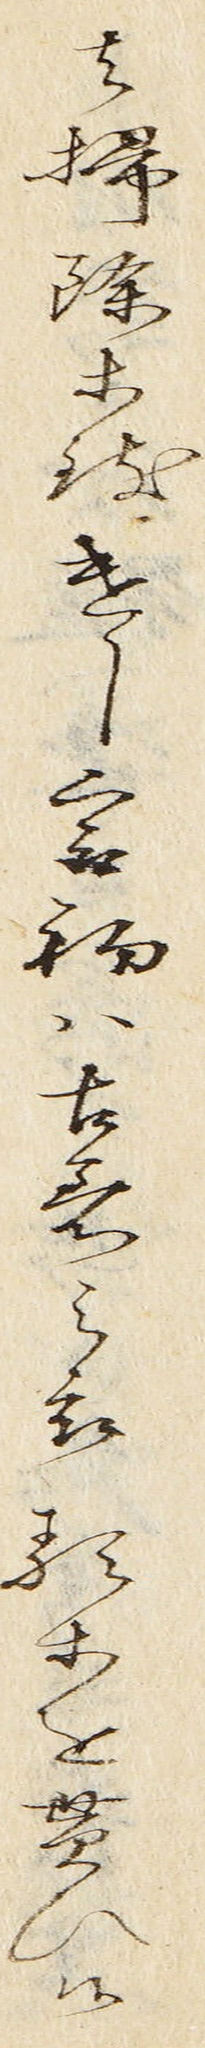は掃除等致遣し最初は古着之衣類等を貰ひ候
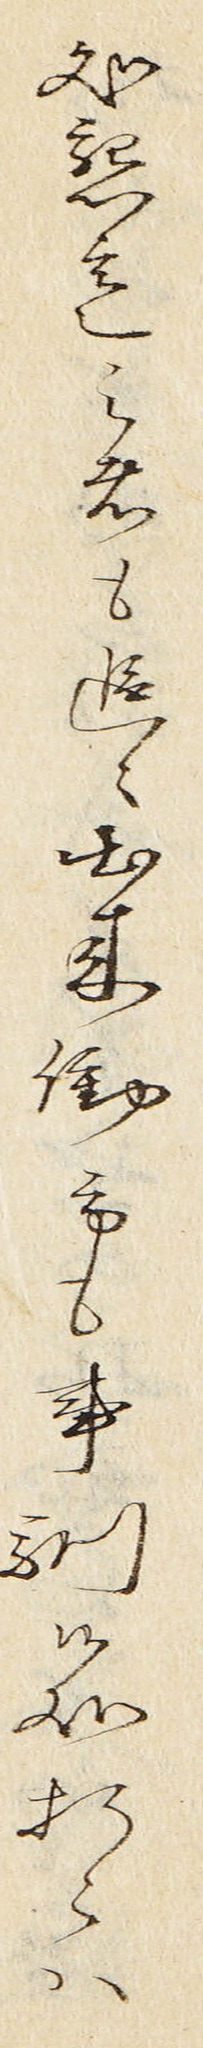処懇意之者も追々出来働方も事馴候処折々は
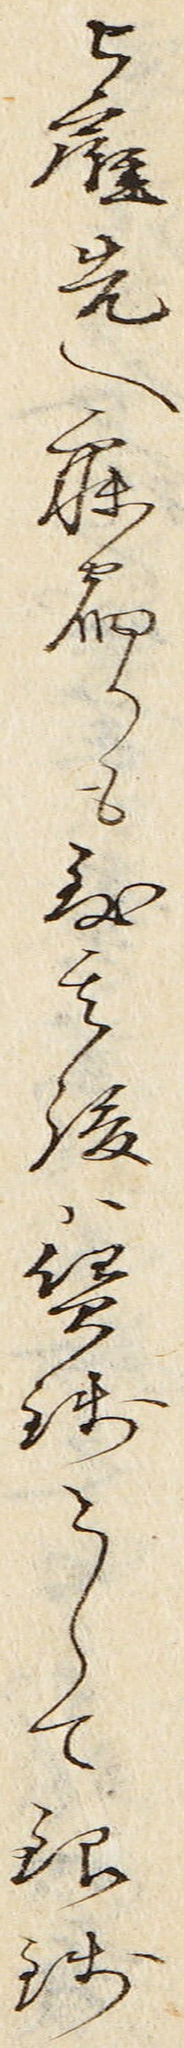被雇先へ寝宿りも致其後は賃銭として銀銭
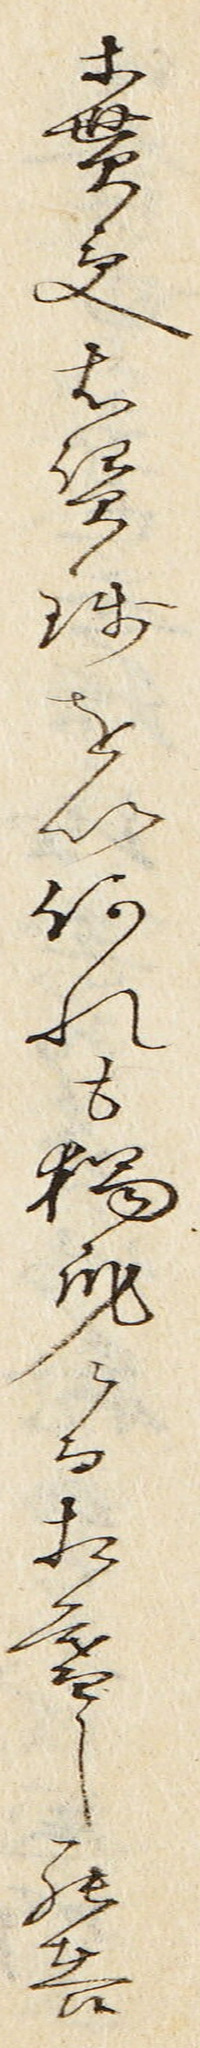相貰受右賃銭を以何れも独身に而相暮そ罷在候
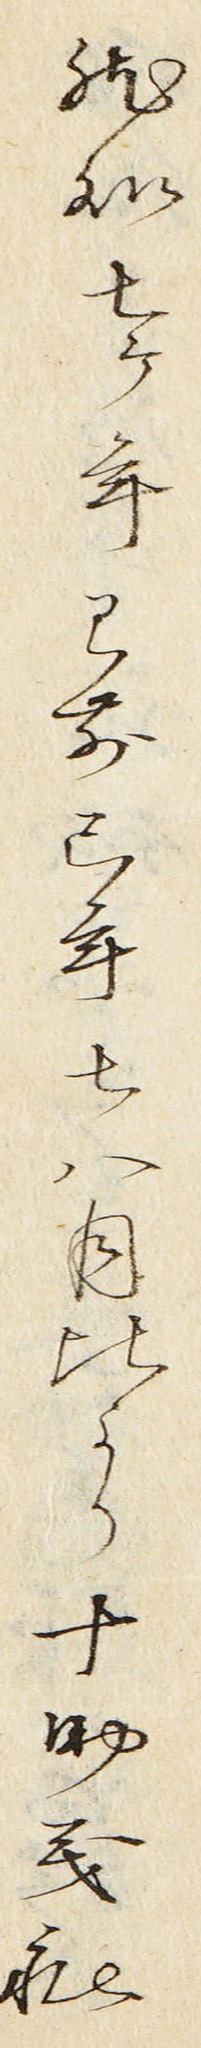然処七ヶ年已前巳年七八比より十助義疵
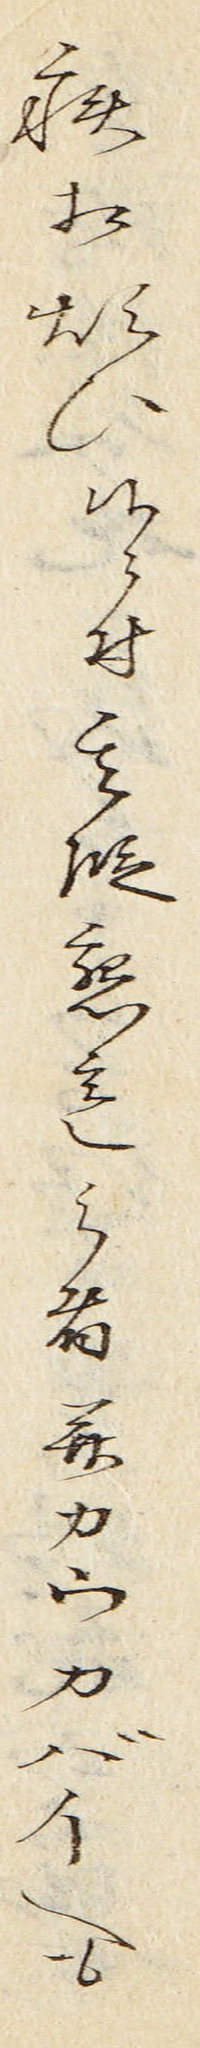疾相煩ひ候に付其段懇意之者幣并カウカバイへも
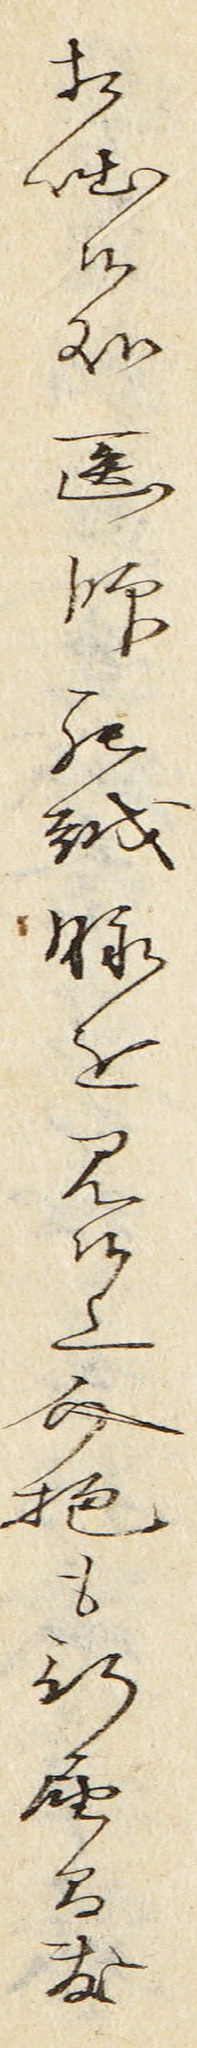相咄候処医師罷越脉を見候上介抱も行届間敷

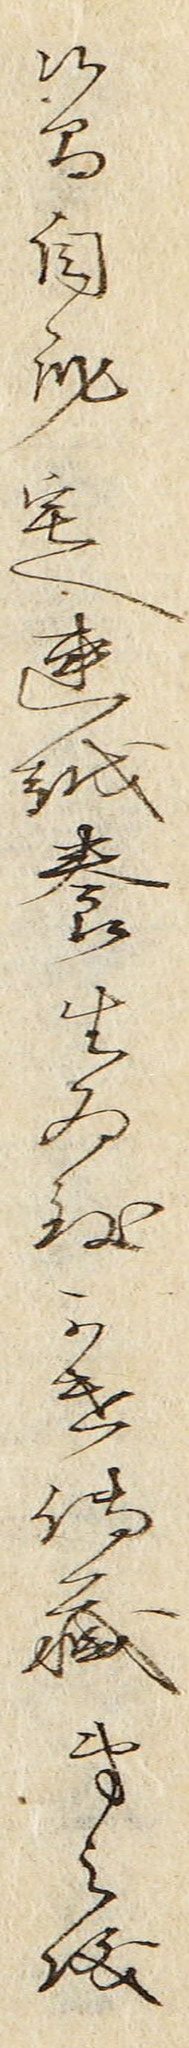候間自身宅へ連越養生為致可遣伝蔵弟之儀
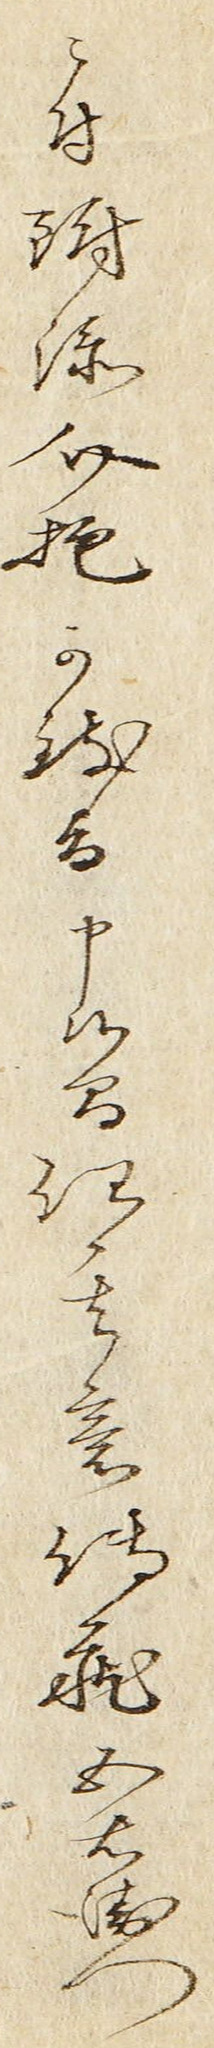に付附添介抱可致旨申候間任其意伝蔵五右衛門
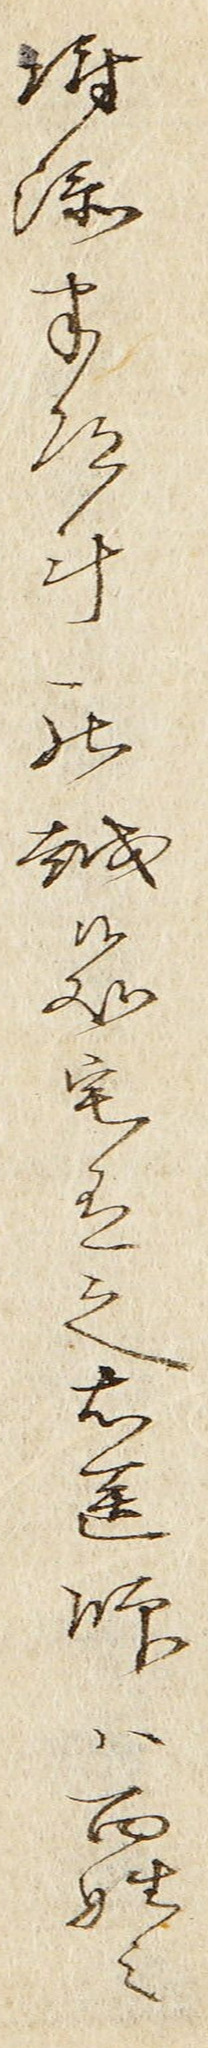附添半道計罷越候処宅有之右医師は百姓之
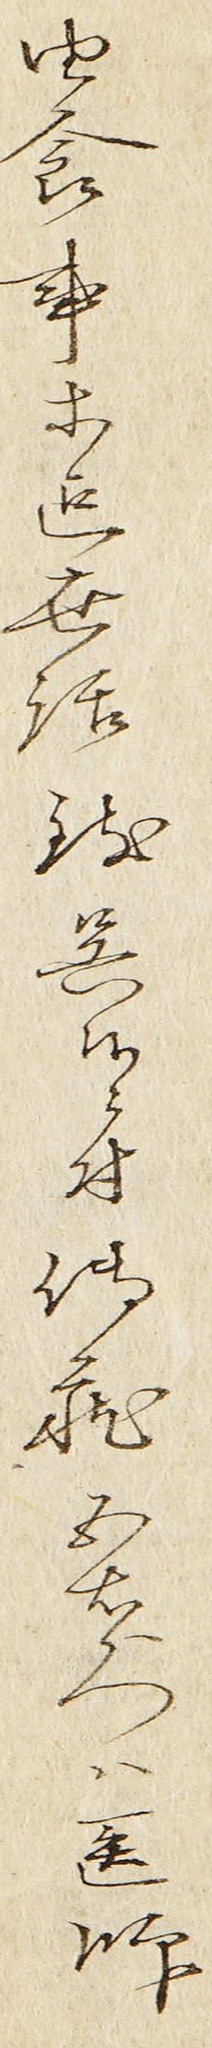由食事等迄世話致呉候に付伝蔵五右衛門は医師
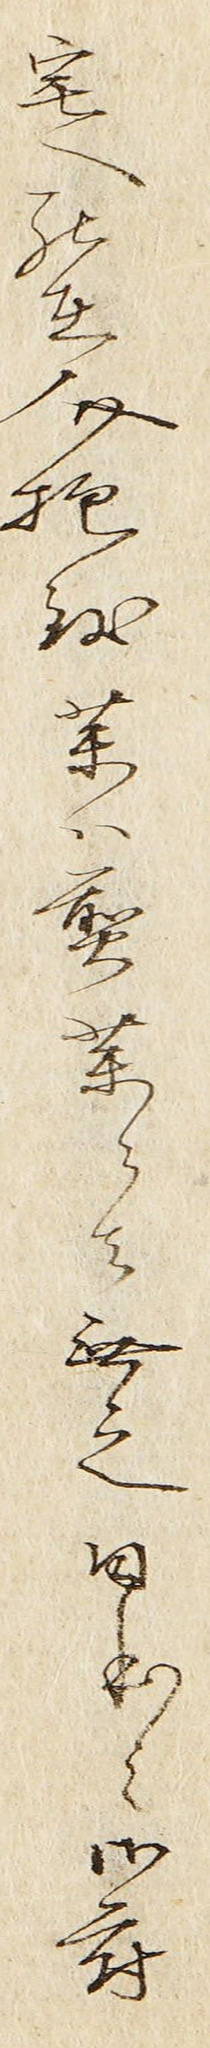宅へ罷在介抱致薬はせん煎茶には無之日本之御府
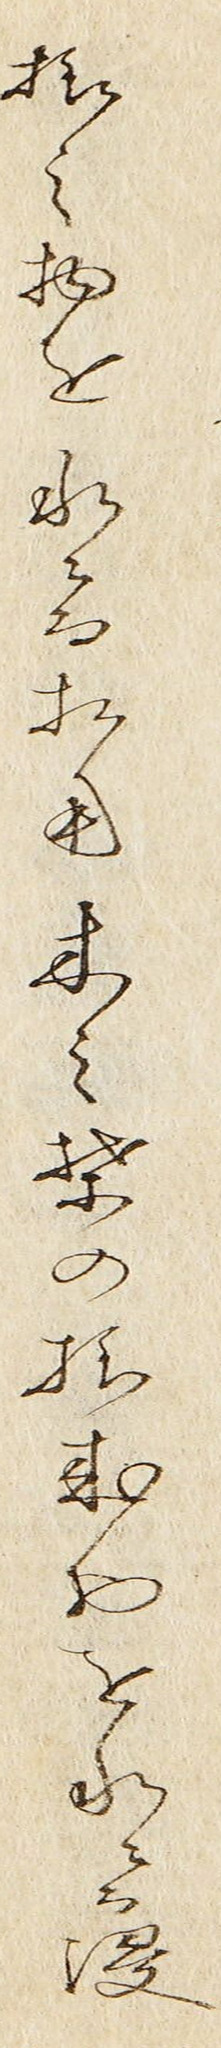様之物を水に而相用木之葉の様なる物を水に而浸
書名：土佐中浜万次郎漂流記
